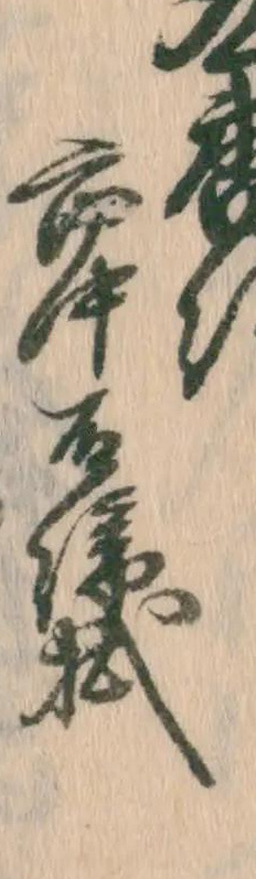市中取締掛

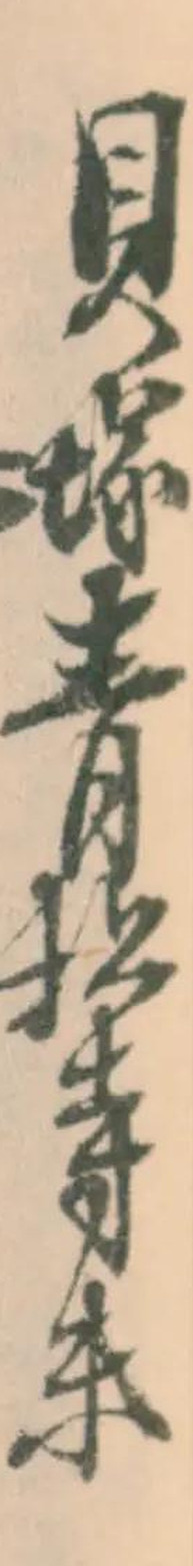貝塚青松寺末
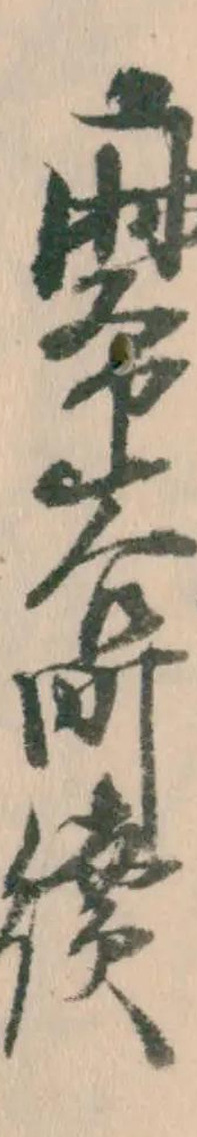麻布谷町続
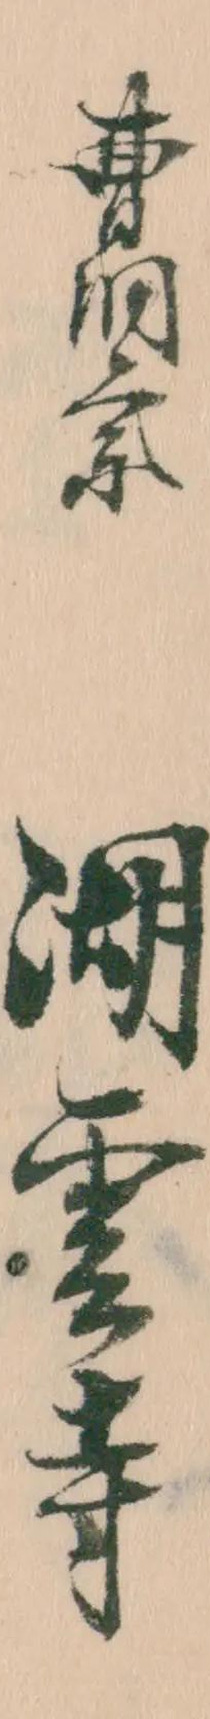曹洞宗湖雲寺
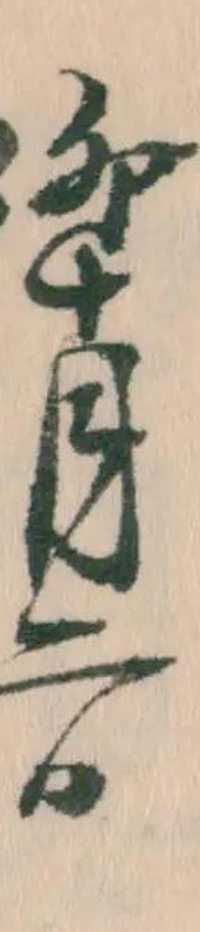卯十月二日
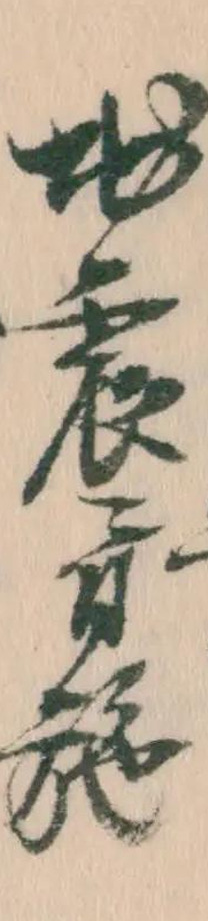地震ニ付施
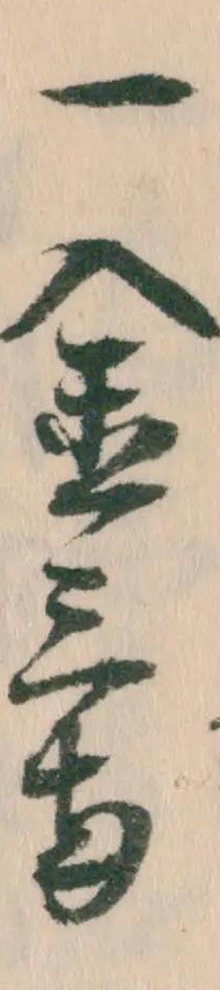一金三両

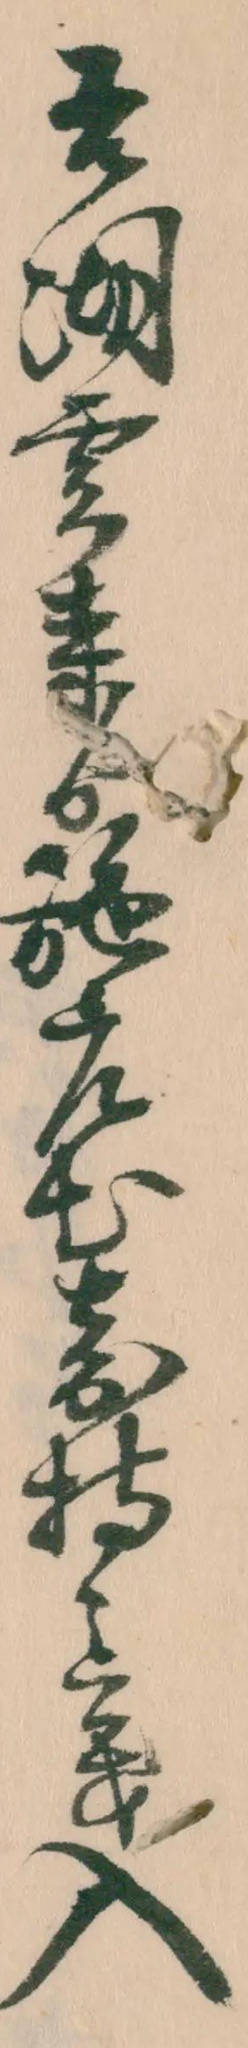右湖雲寺ゟ施差出奇特之義入
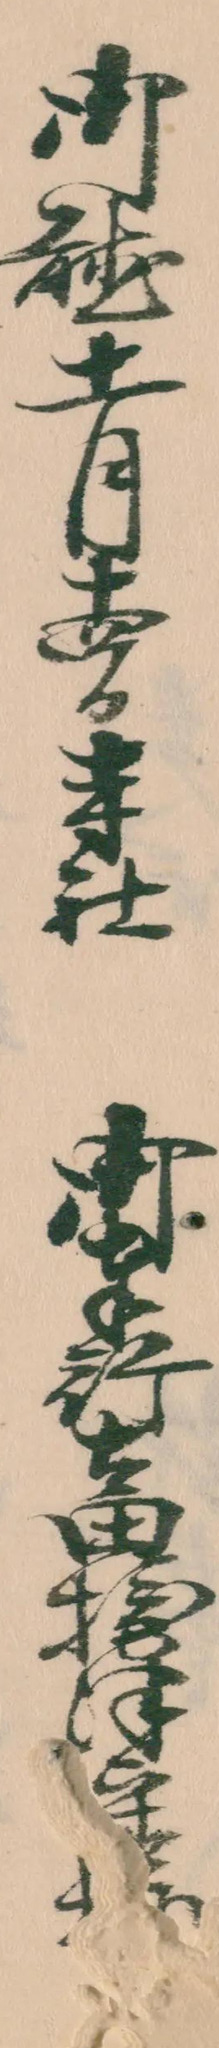御聴十一月十四日寺社御奉行太田摂津守様
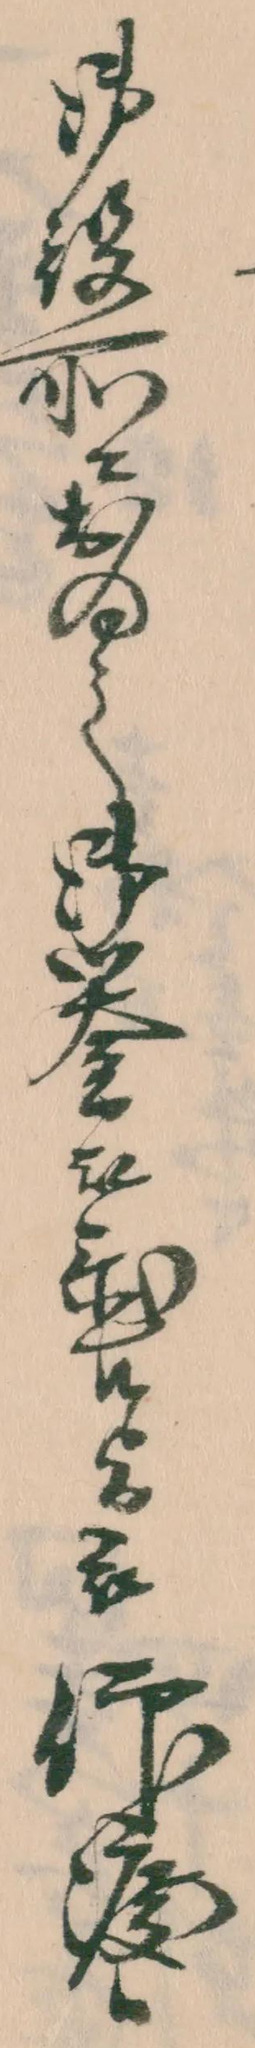御役所ニおゐて御誉被置候旨被仰渡候
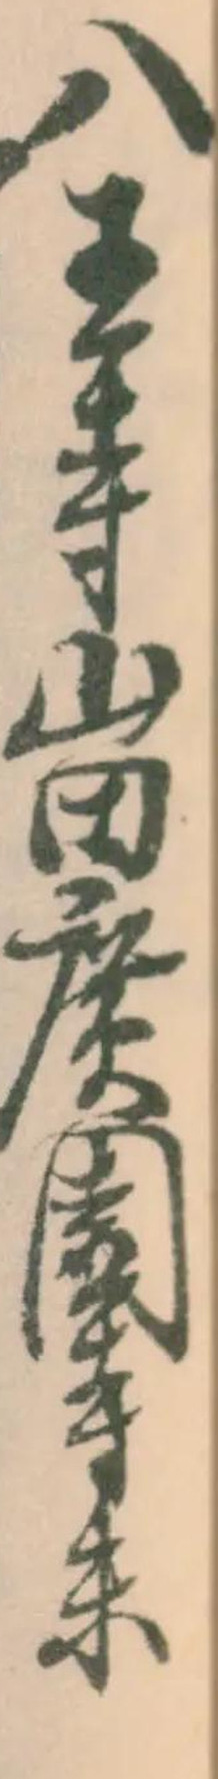八王子山田広園寺末
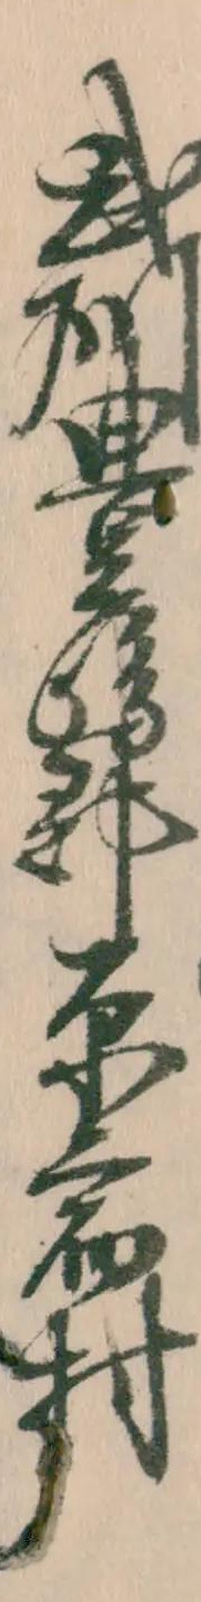武州豊島郡原宿村
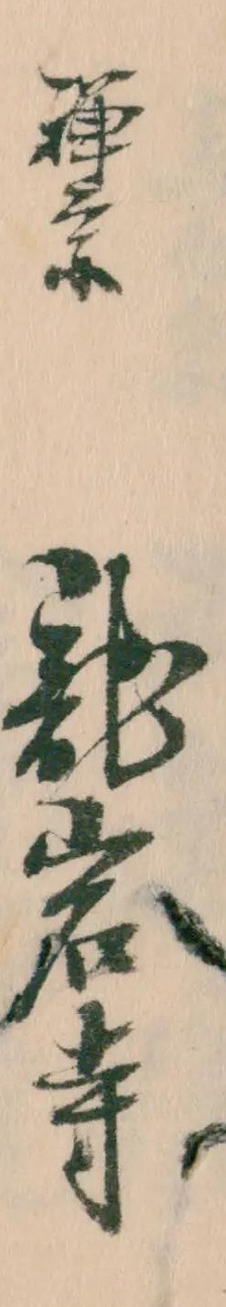禅宗龍岩寺
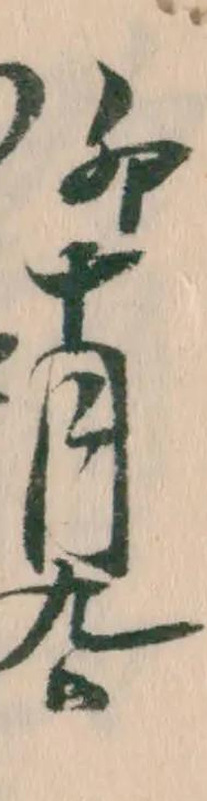卯十月九日
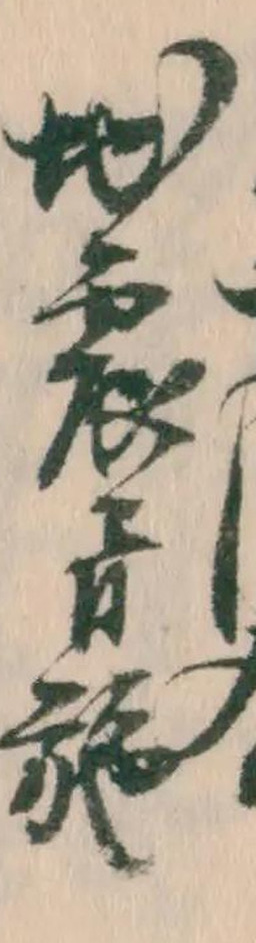地震ニ付施
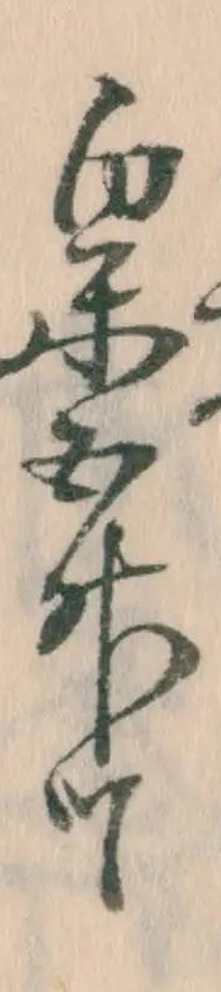白米五升ツヽ
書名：武家方并寺院等ニテ施差出候一件
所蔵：国立国会図書館 National Diet Library, JAPAN
